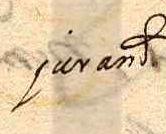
juramto
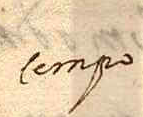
tempo
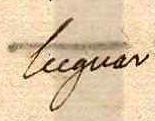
luguar
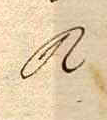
R
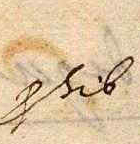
ꝓhib
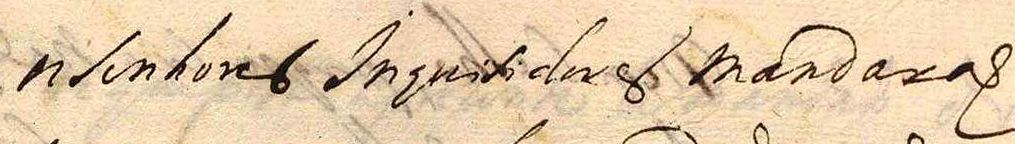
os senhores Inquisidores mandaraõ
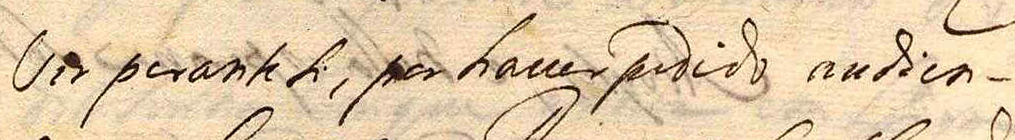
vir perante si, por hauer pedido audien
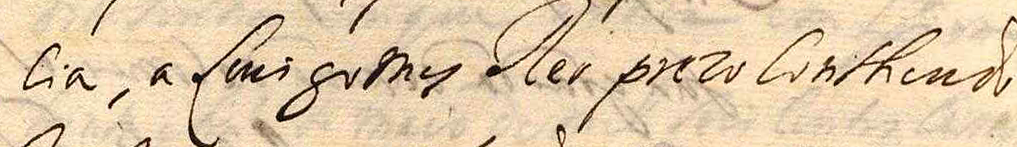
cia, a Luis gomes Reo prezo Contheudo
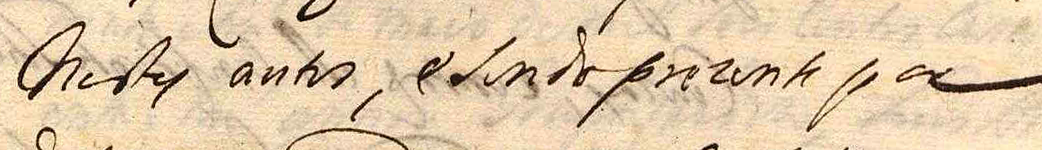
Nestes autos, e sendo prezente por
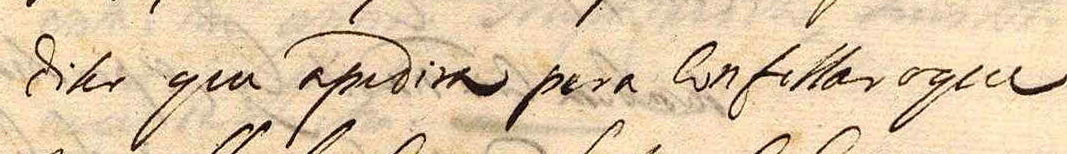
diser que a pedira pera confessar o que
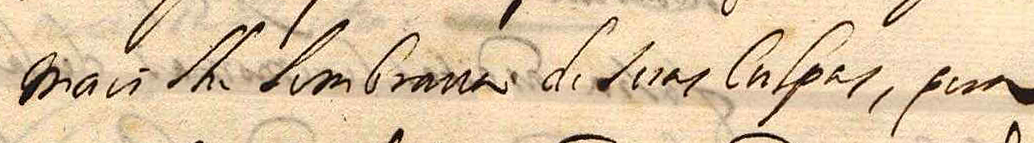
mais lhe lembraua de suas Culpas, pera
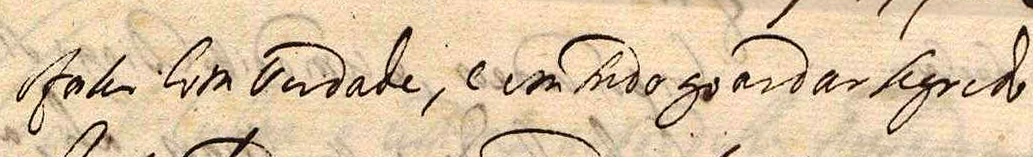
o faser com verdade, e em tudo goardar segredo
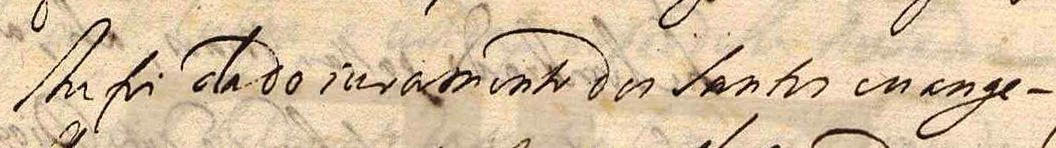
lhe foi dado iuramento dos santos euange
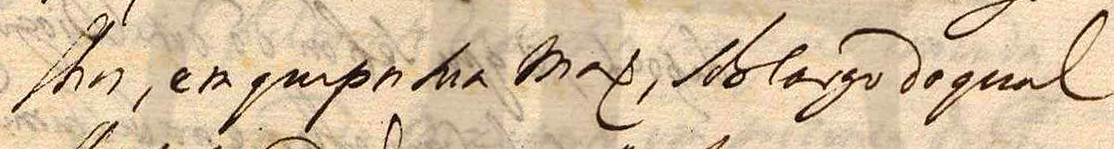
lhos, em que pos sua maõ, sob cargo do qual
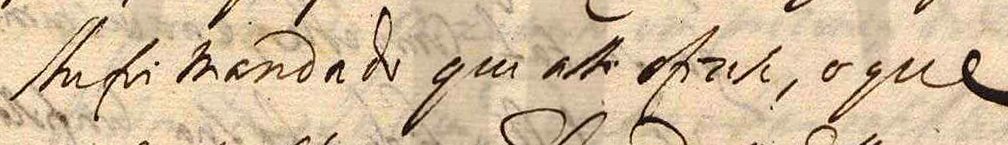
lhe foi mandado que assi o fizese, o que
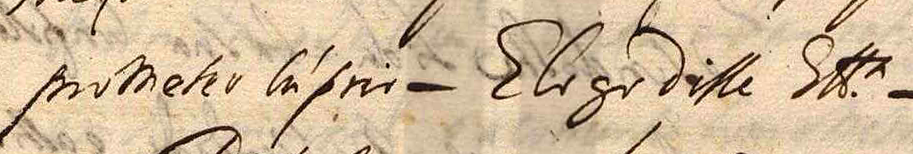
prometeo cūprir ‒ E logo disse Ett.a
